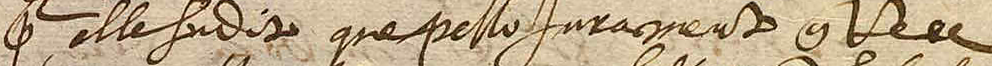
p̄or elle foi dito que pello Juramento q̄ Rece
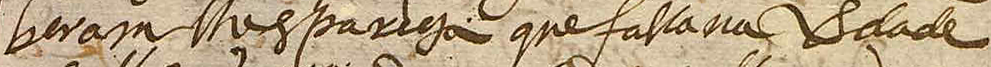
beram lhes parecja que fallaua ꝟdade
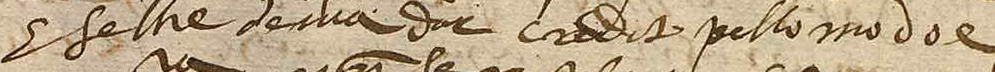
E se lhe deuia dar credito pello modo e
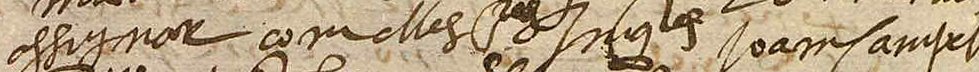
assignar com elles sres Jmqres Joam Campello
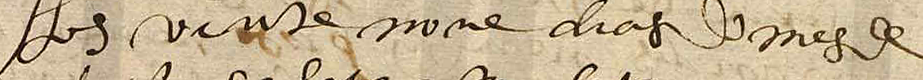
Aos vinte noue dias do mes de
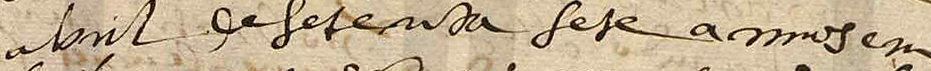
abriL de setenta sete annos em
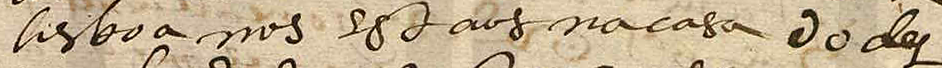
lisboa nos Estaos na casa do des
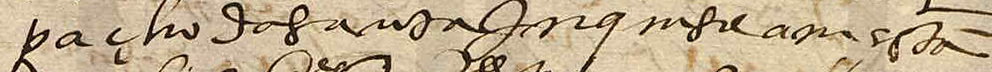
pacho da santa Jnquisicam Estā
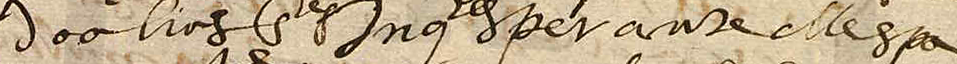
do ali os sres Jnqres perante elles pa
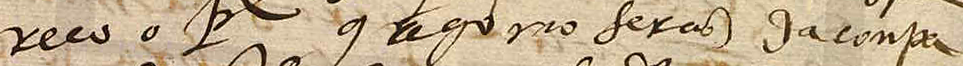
receo o Pe gregorio seraõ da compa
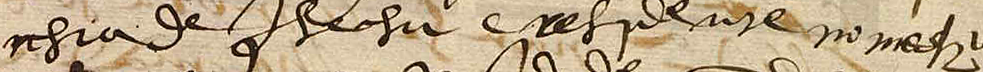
nhia de Jhesu e resjdente no mostro
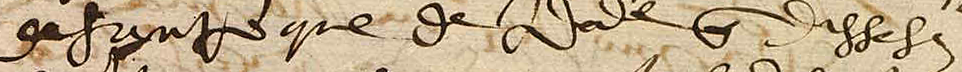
de san Roque de Jdade q̄ disse ser
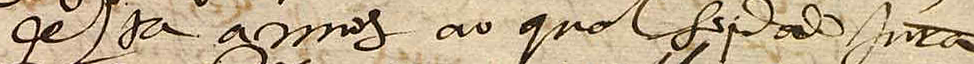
de Lta annos ao qual foj dado Jura
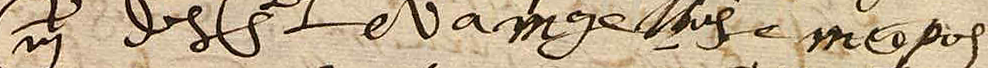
mto dos stos evamgelhos em q̄ pos
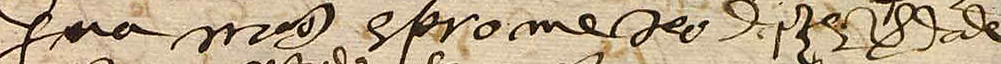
sua maõ E prometeo dizer ꝟdade
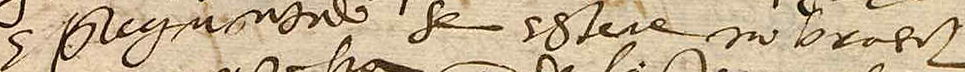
E preguntado se Esteue no brasiL
